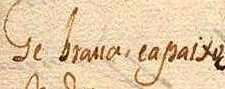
He braua e apaixo
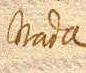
nada
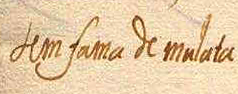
tem fama de mulata
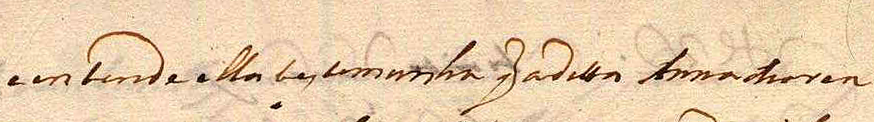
e entende ella testemunha q̄ a ditta Anna Maria
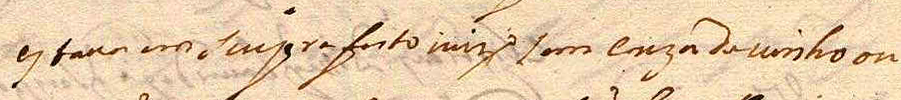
estaua em seu prefeito iuizo sem couza do uinho ou
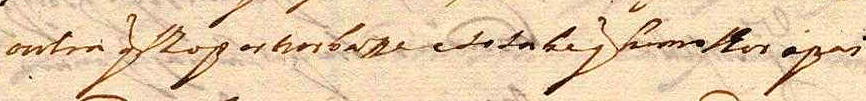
outra q̄ lho pertrorbasse e so sabe q̄ he molher apai
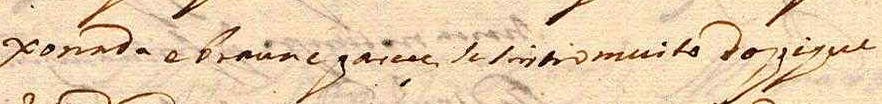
xonada e braua e pareçe se sintio muito do pique
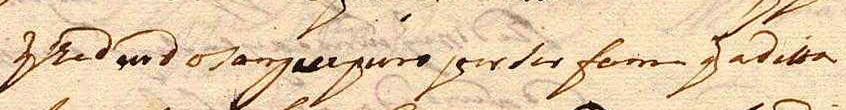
q̄ he doudo sangue puro por ser fama q̄ a ditta
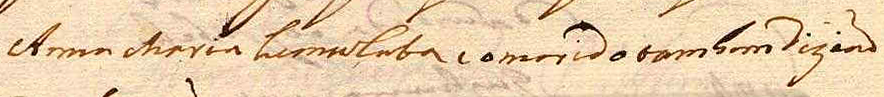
Anna Maria he mulata, e o marido tambem dizen
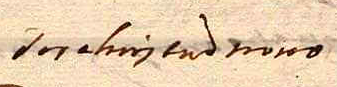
ser christaõ nouo
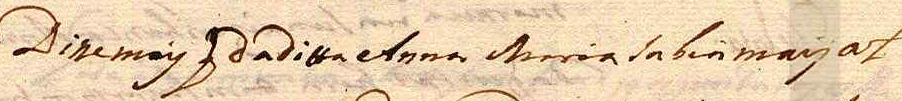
Disse mais q̄ da ditta Anna Maria sabia mais al
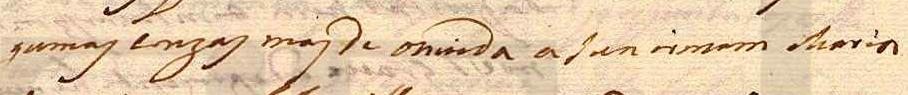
gumas couzas mas de ouuida a sua irmam Maria
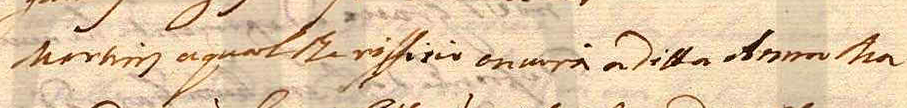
Martins a qual lhe riffirio ouuira a ditta Anna Ma
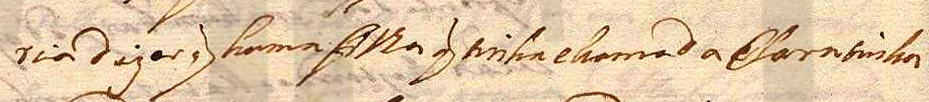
ria dizer q̄ huma filha q̄ tinha chamada Clara tinha
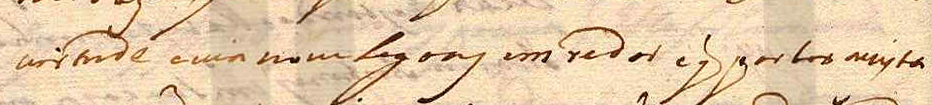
uirtude e uia noue legoas em redor, e q̄ por ter a uista
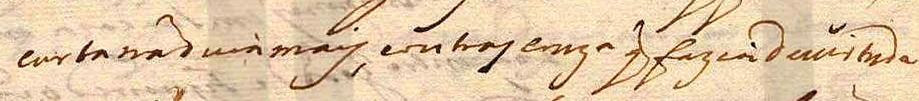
curta naõ uia mais, e outras couza q̄ fazia de uirtude
